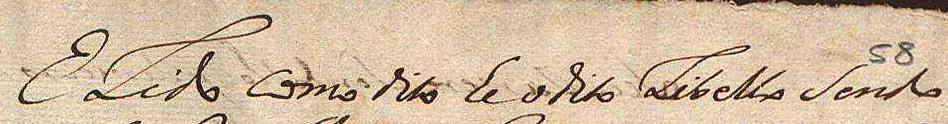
E Lido como dito he o dito Libello sendo
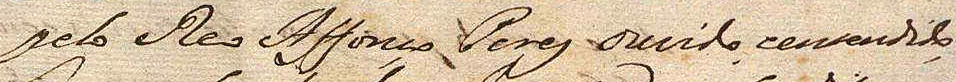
pelo Reo Affonço Peres ouvido, e entendido
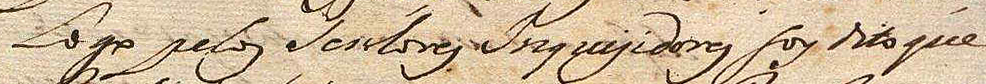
Logo pelos senhores Inquisidores foy dito que
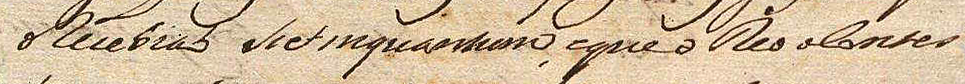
o Recebiaõ si et inquantum, e que o Reo o Contes
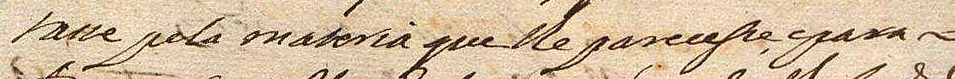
tasse pela materia que lhe parecesse, e para
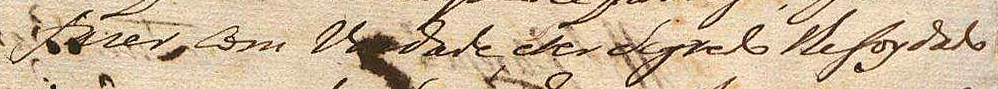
Fazer, com Verdade e ter segredo lhe foy dado
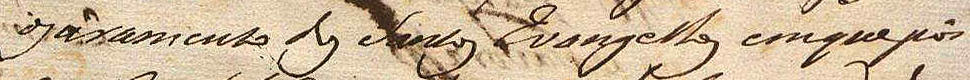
o juramento dos Santos Evangelhos em que pôs
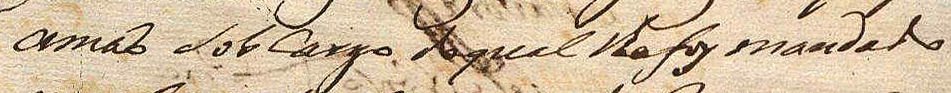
a maõ sob cargo do qual lhe foy mandado
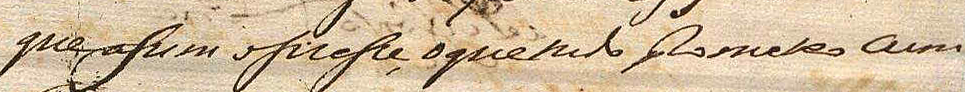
que assim o fizesse, o que tudo prometeo cum
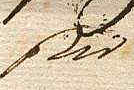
prir
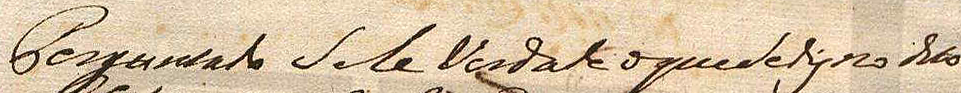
Perguntado se he Verdade o que se dis no dito
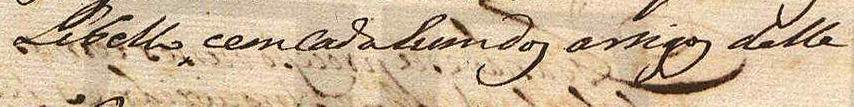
Libello, e em cada hum dos artigos delle
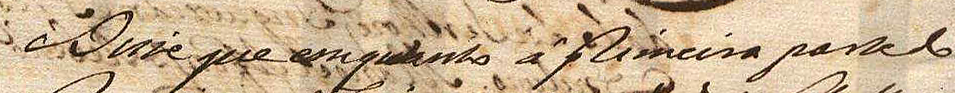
Disse que emquanto à pRimeira parte do
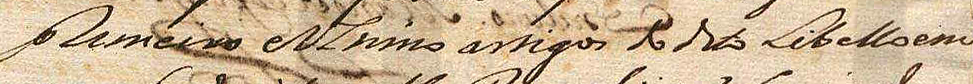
pRimeiro e VLtimo artigos do dito Libello em
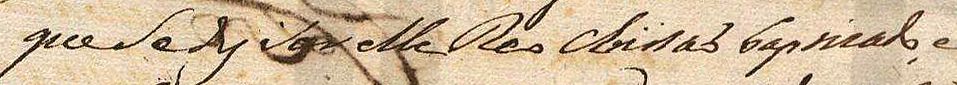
que se dis ser elle Reo christaõ baptizado, e
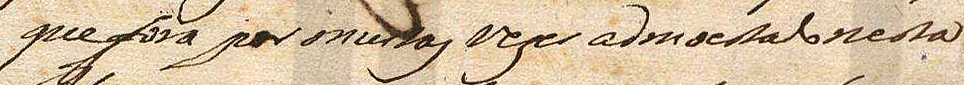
que fora por muitas vezes admoestado nesta
